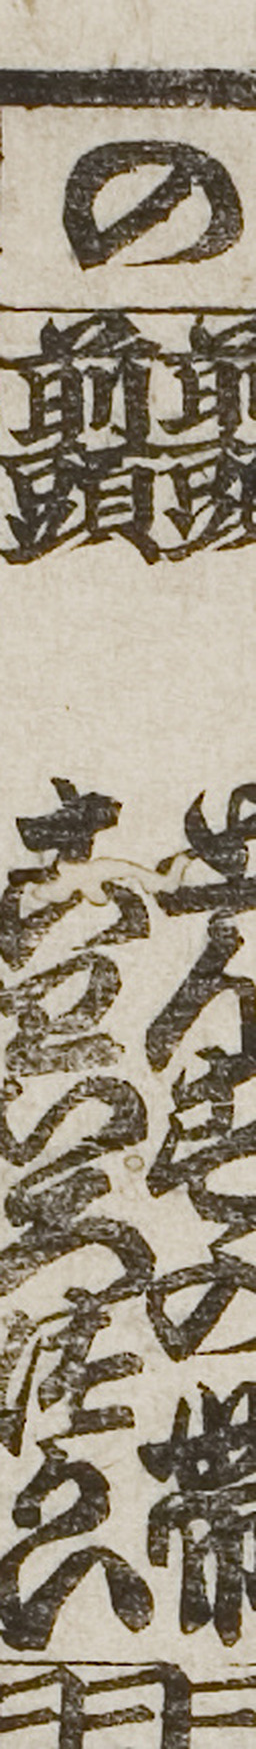前頭こわいろつかい
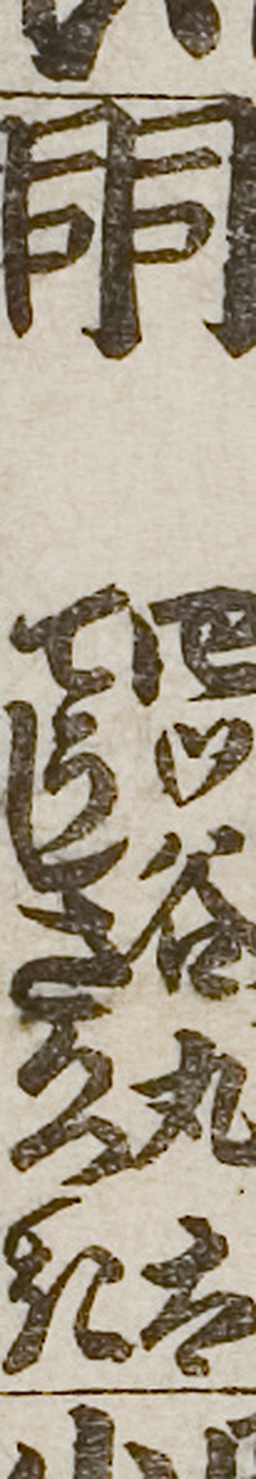同てうしさかつき
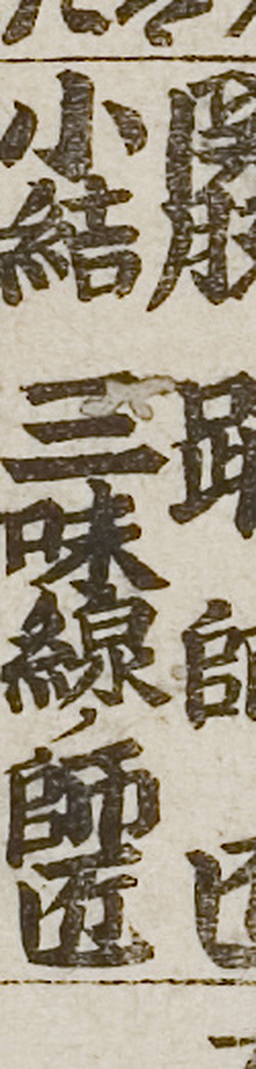小結三味線ノ師匠
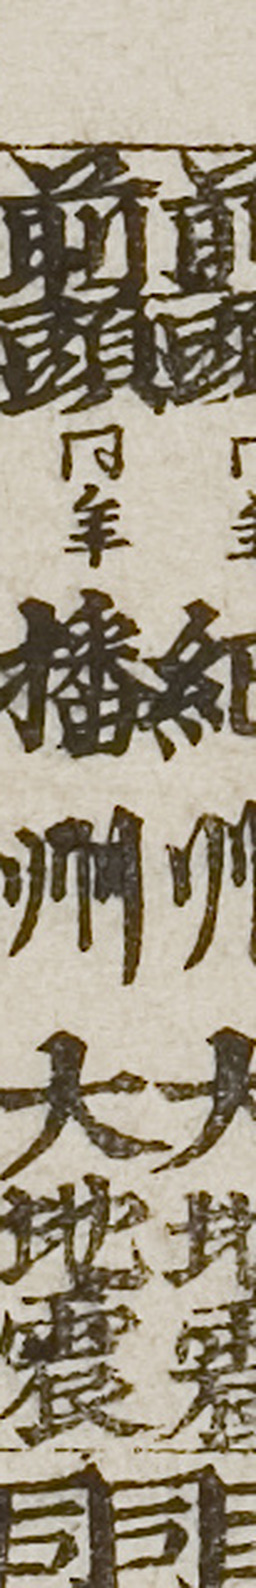前頭同年播州大地震
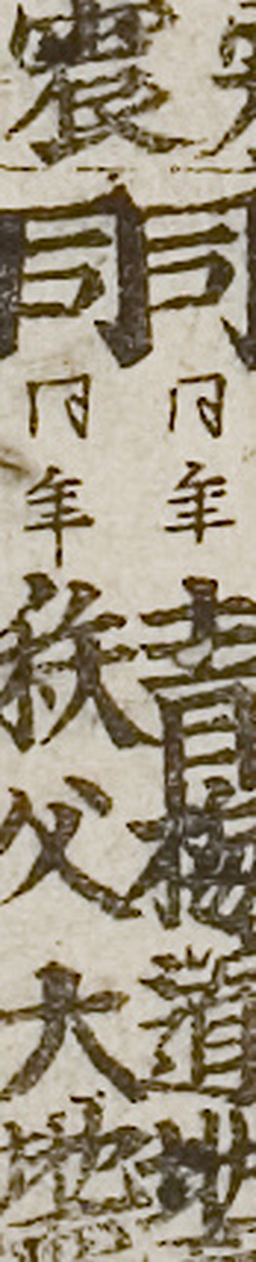同同年秩父大地震
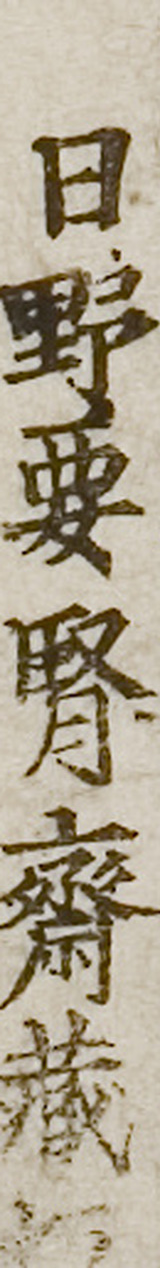日野要腎齋蔵板
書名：世中当座帳
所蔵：東京大学総合図書館 General Library in the University of Tokyo, JAPAN
